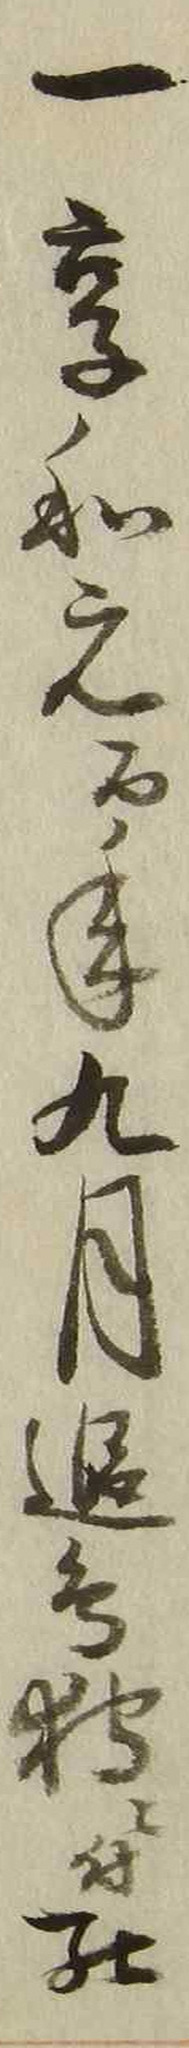一享和元酉年九月追鳥狩ニ付罷
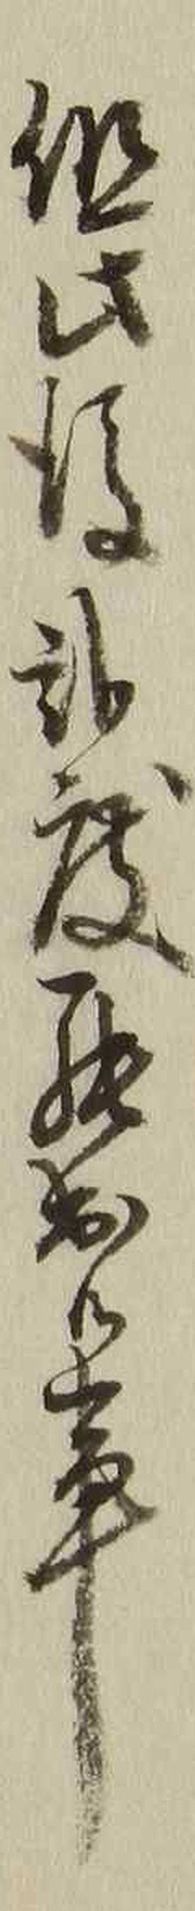但此後弐度罷出候事
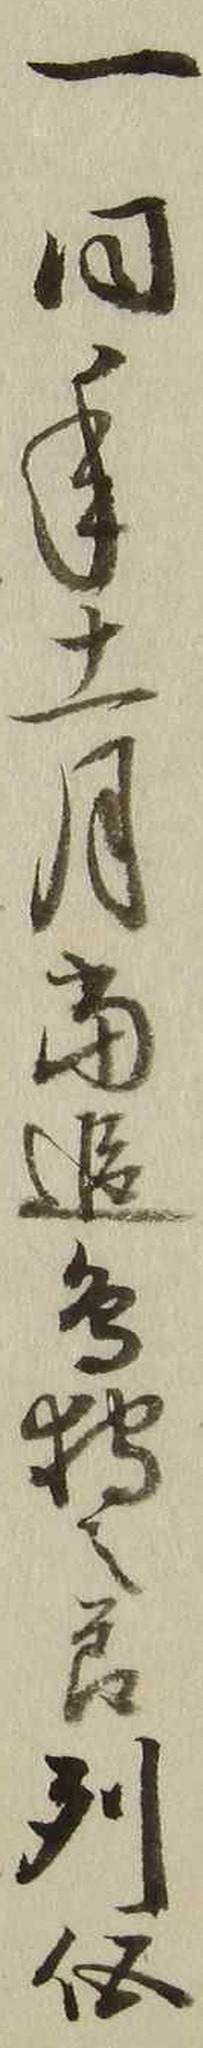一同年十一月当追鳥狩之節列伍
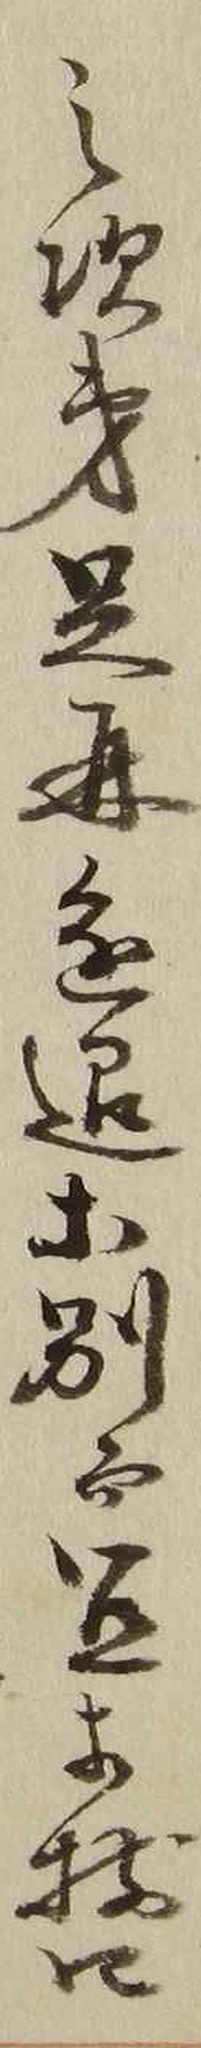之次第足再進退等別而宜相揃四
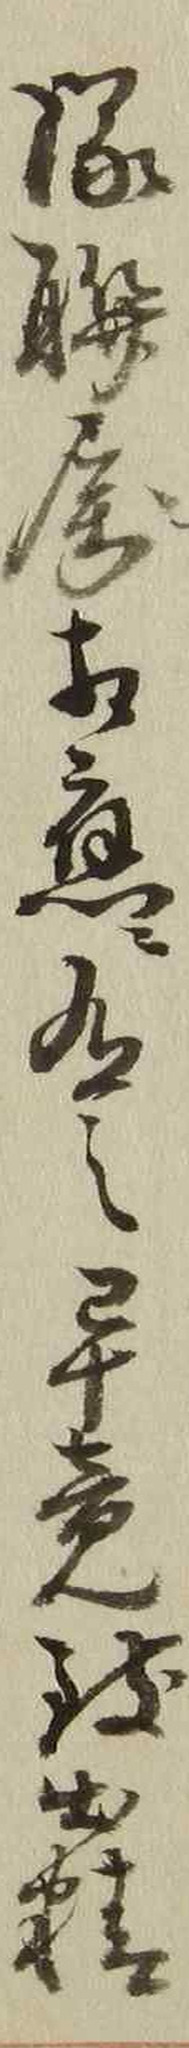隊聯属相応ニ有之畢竟致出精
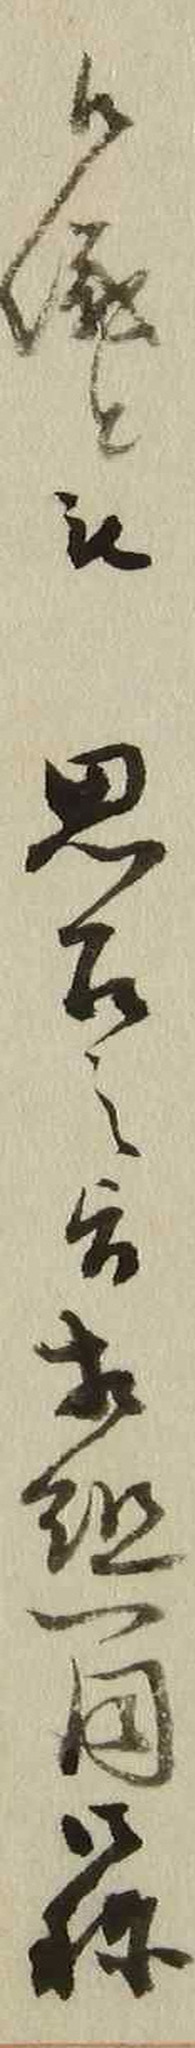候儀と被思召之旨相組一同御称
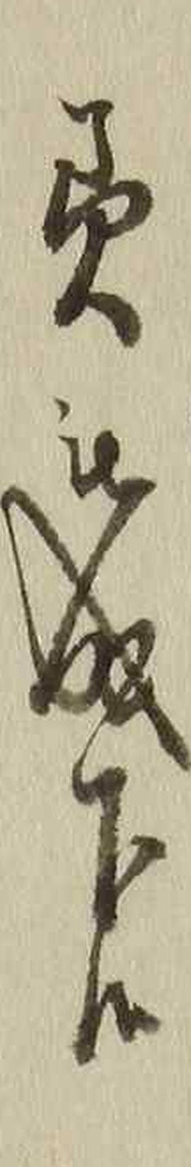美被成下候
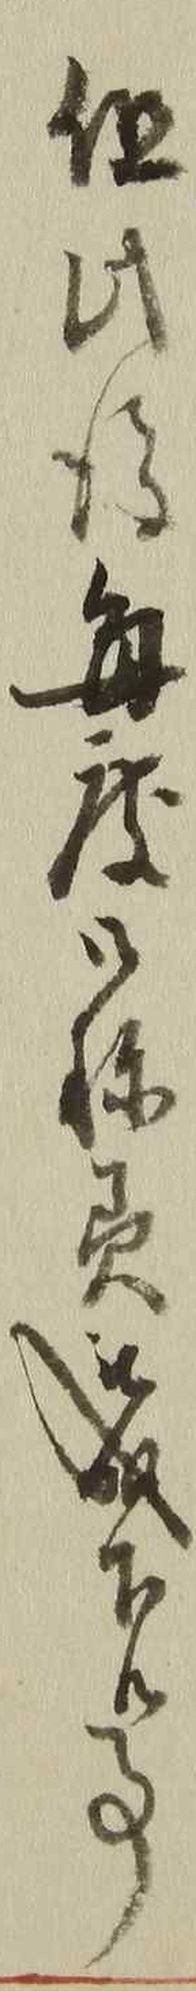但此後毎度御称美被成下候事
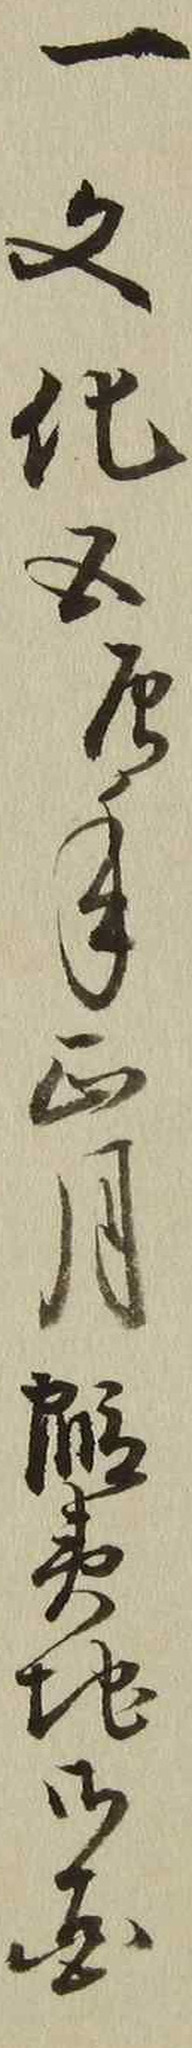一文化五辰年正月蝦夷地御固
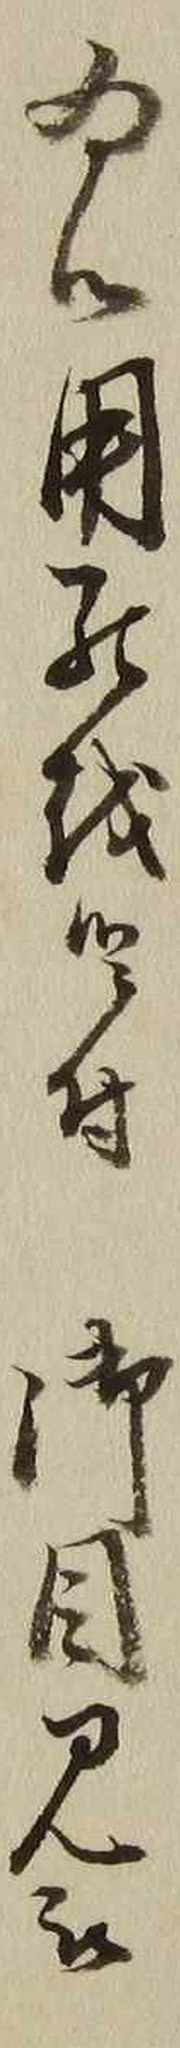為御用罷越候ニ付御目見被
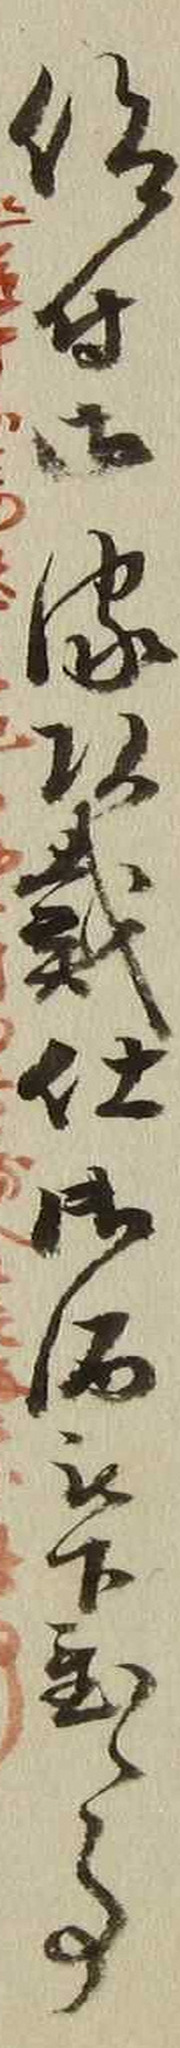仰付御流頂戴仕御酒被下置候事
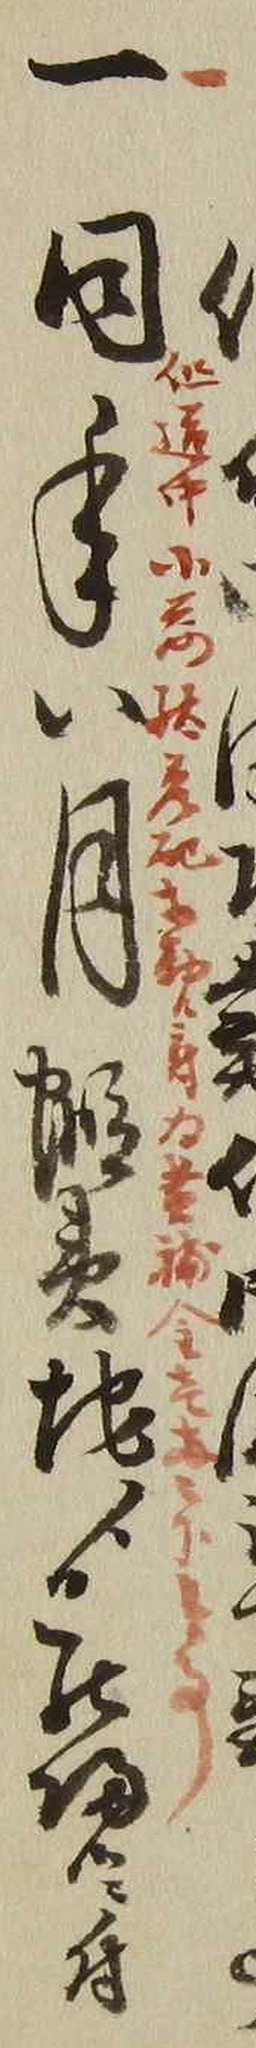一同年八月蝦夷地ゟ罷帰候ニ付
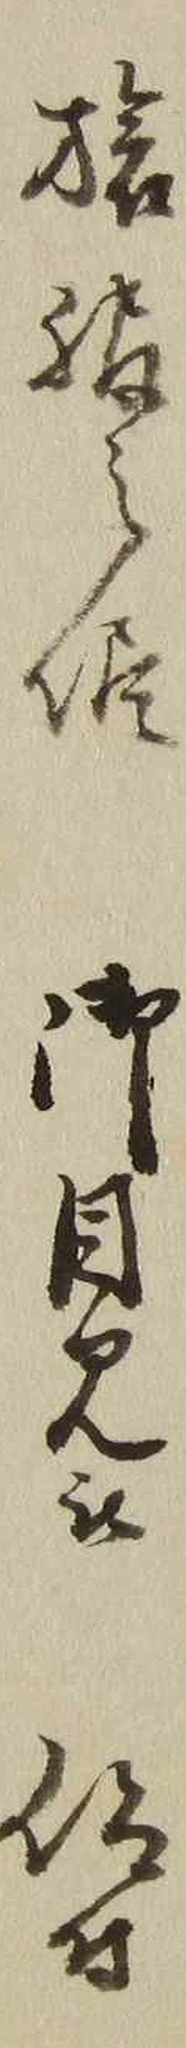旅服之儘御目見被仰付
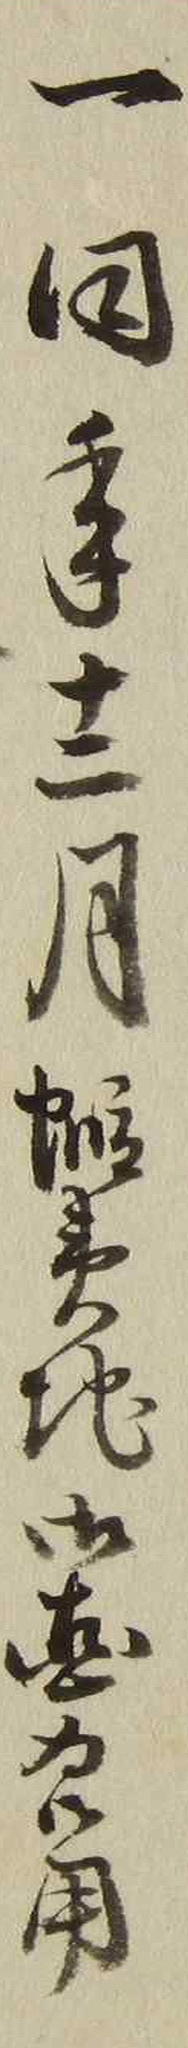一同年十二月蝦夷地御固為御用
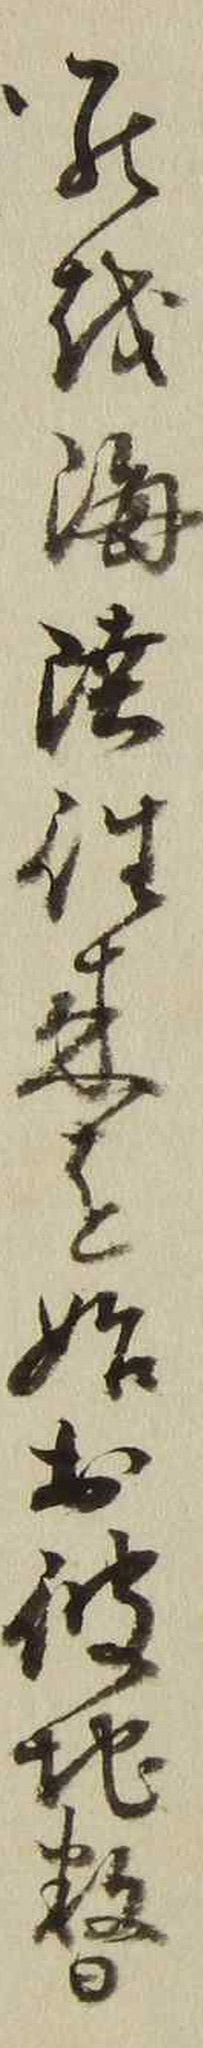罷越海陸往来を始於彼地数日
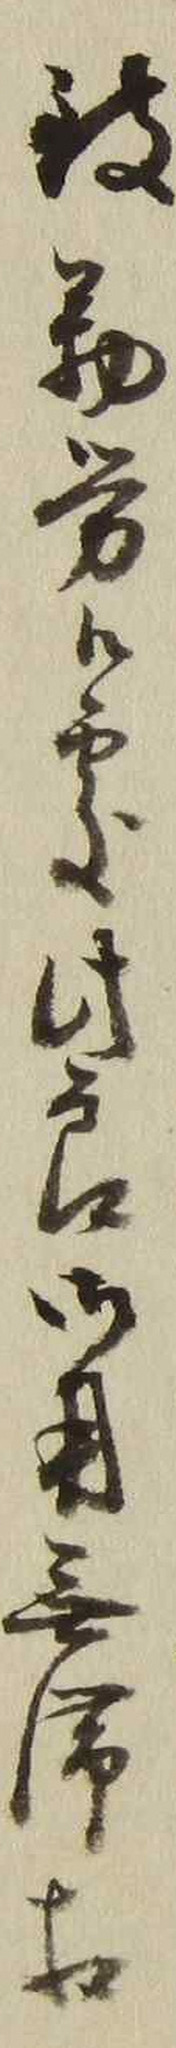致勤労候処此節御用無滞相
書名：諸士系譜　巻之53　に之部4
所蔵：会津若松市立会津図書館
